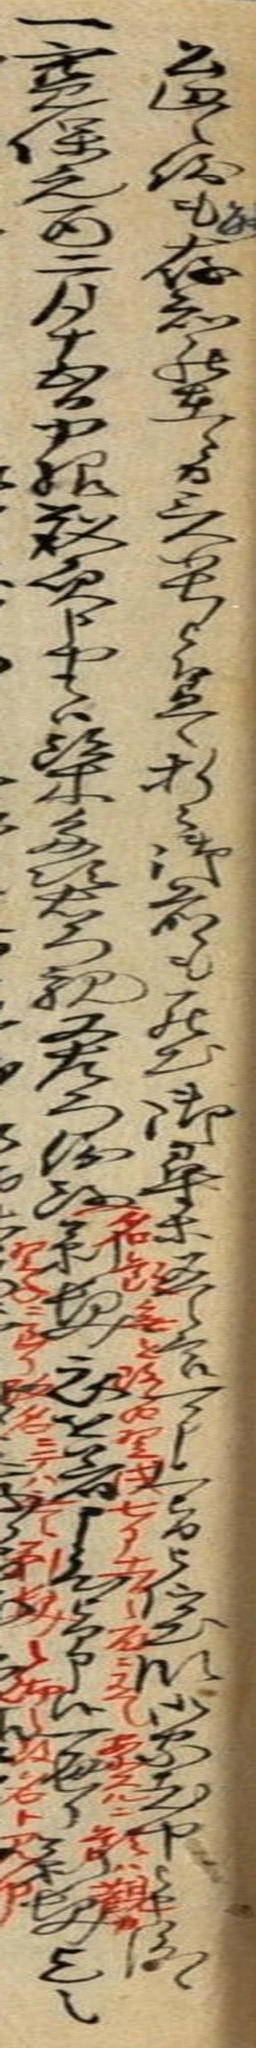一寛保元酉二月十五日中根靭負申聞候は鈴木多次右衛門親又左衛門儀剃髪衣を着申度旨申候一通り剃髪迄之
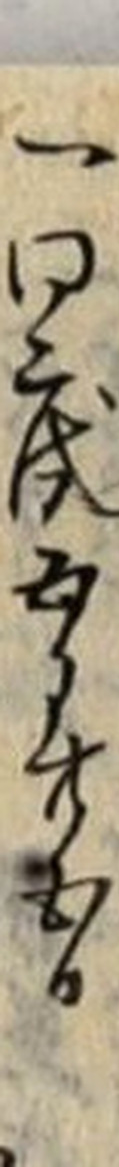一同二戌五月廿五日
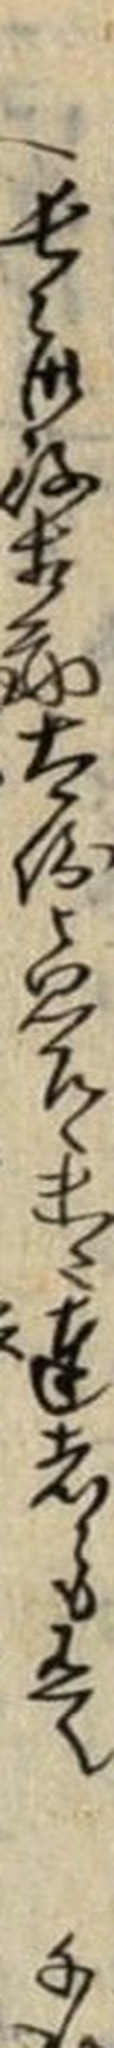長々御役相勤太儀に被思召未た達者も有之
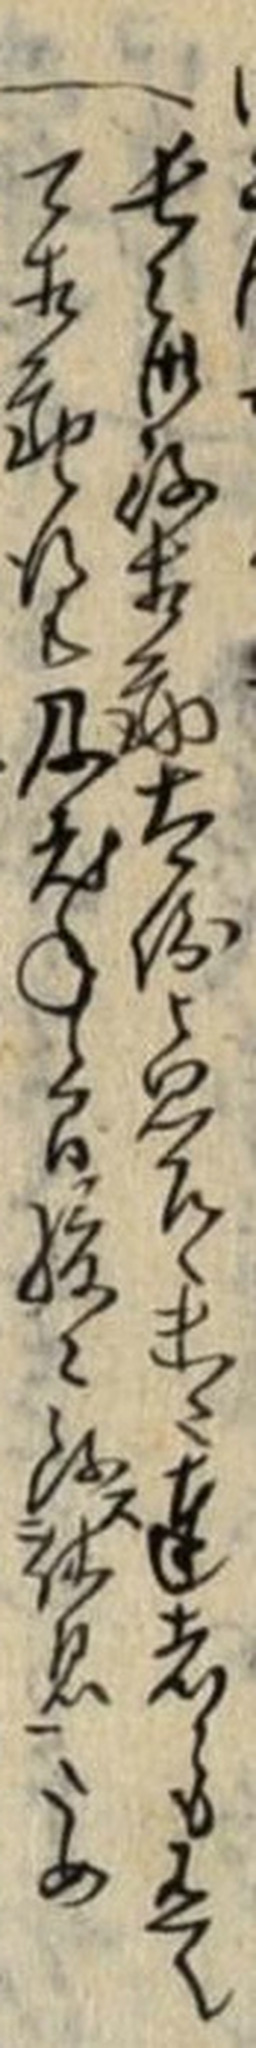可相勤候得共及老年候間緩々致す休息ため御奉行
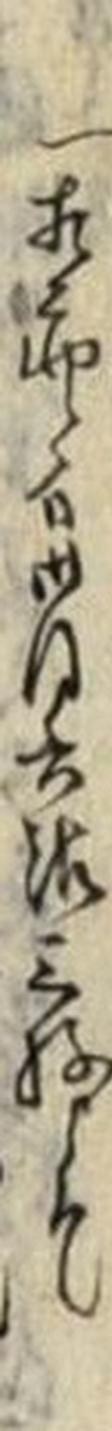相勤候に付御目六銀三枚被下候
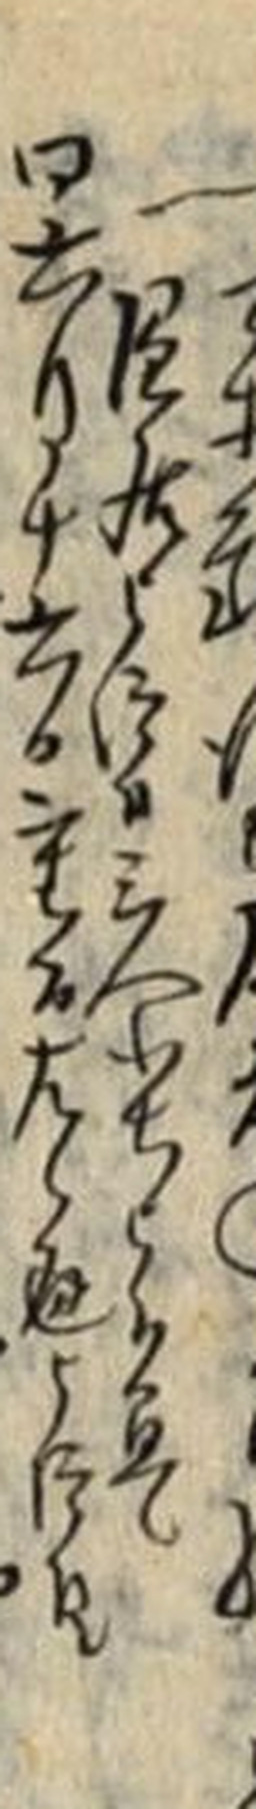一同六月十六日重而左之通被仰付候
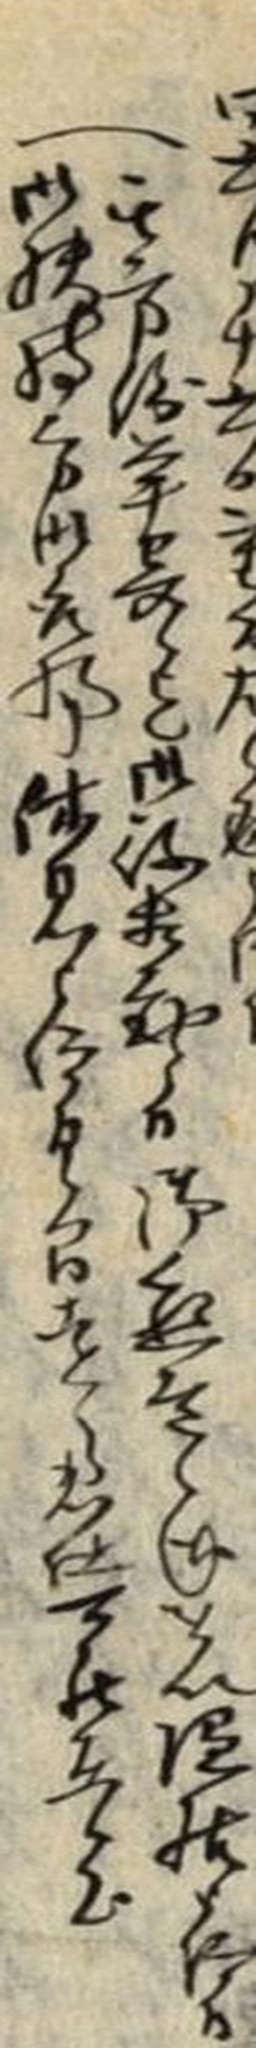御扶持方御取揚休息被仰付候間遠慮仕可罷在候以上
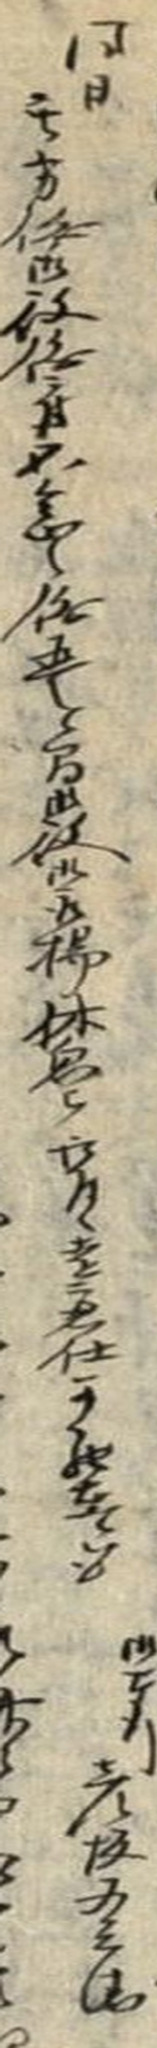其方儀御役儀に付不念之儀有之候間御役御取揚休息被仰付候遠慮仕可罷在候以上御奉行彦坂又兵衛
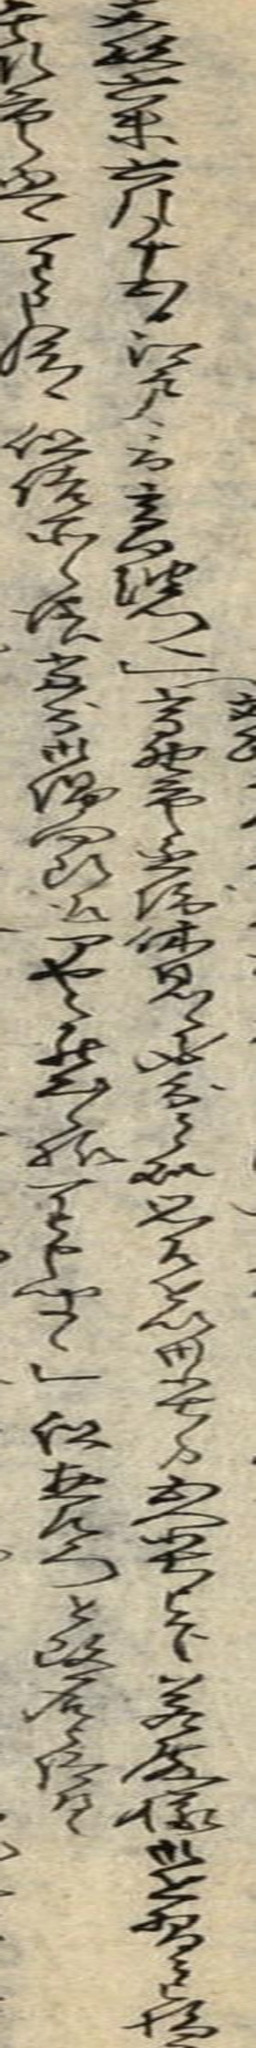其段市之丞へ可被申渡候但詰所之儀は当分御側向頭取部屋へ罷出候様可被申聞候」但惣左衛門と改名被仰付候
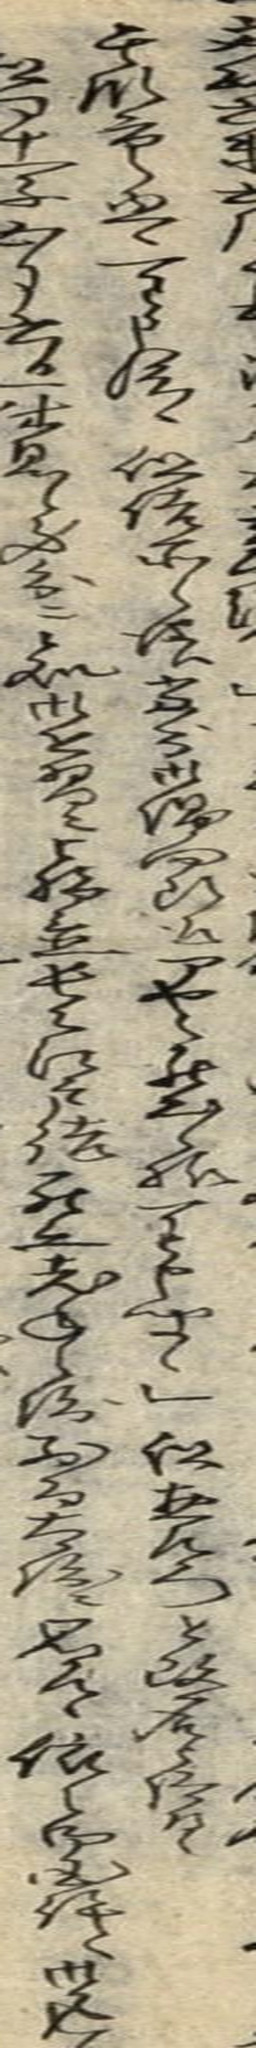但同十一子五月六日」休息之身分に候処御近習に被指置長々江戸詰罷在老年之儀別而太儀に思召候依之御国許へ御返被成
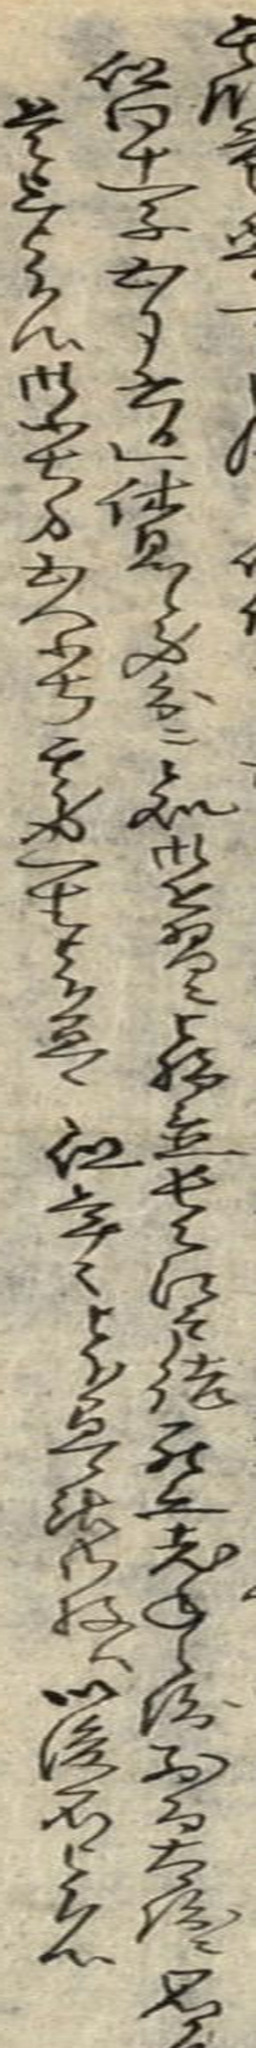是迄被下候御ふち方五人ふち其身一生被下置候但年々被下置候銀弐枚は以後不被下候
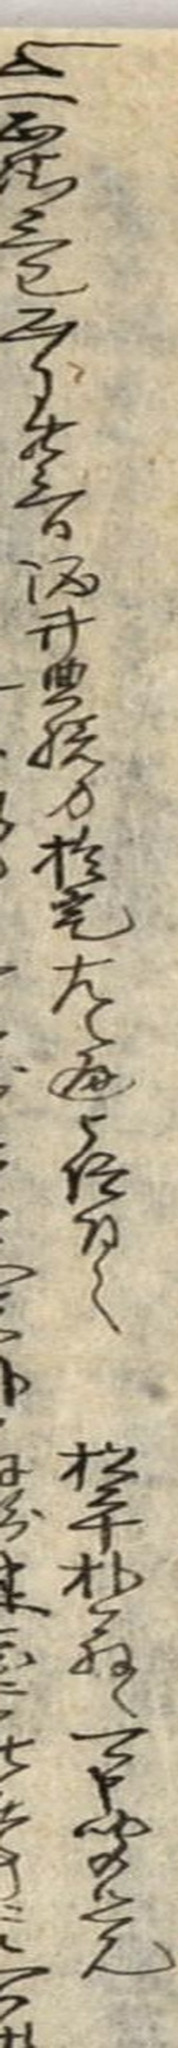△一正徳三巳正月廿三日酒井典膳方於宅左之通被仰付之松平朴翁へ可申聞覚
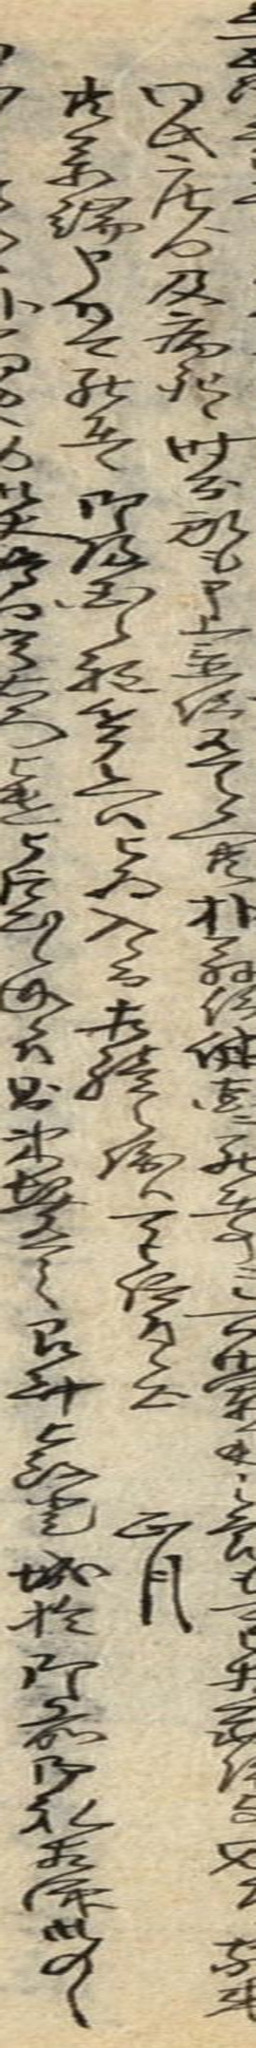同五月廿八日朴翁方へ為御使嶋田宇右衛門被遣被仰出候趣に付束髪有之即刻被致登城於御前御礼相済御のし
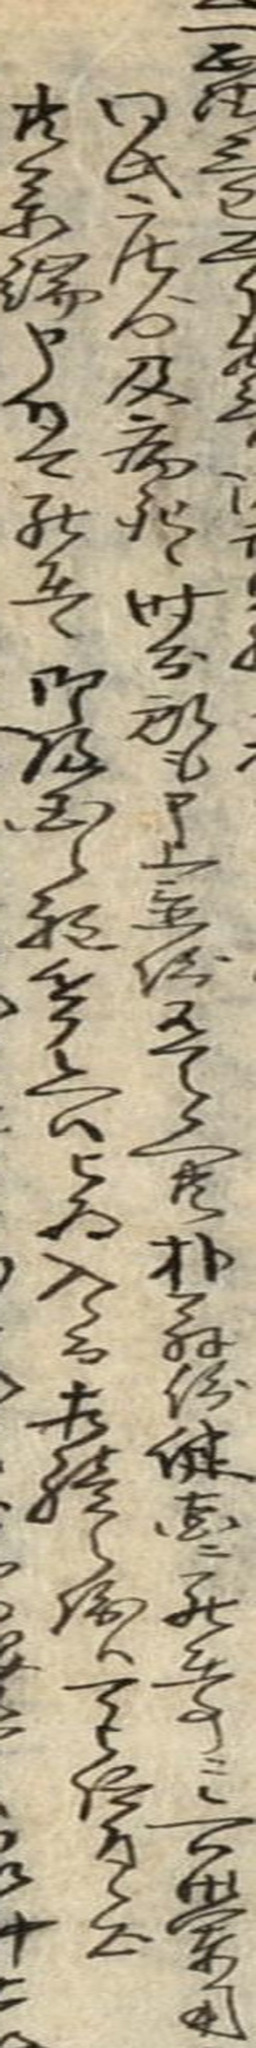共万端申付可罷在候御帰国之程近々に候へは被為入候而相続之儀は可被仰付候以上正月
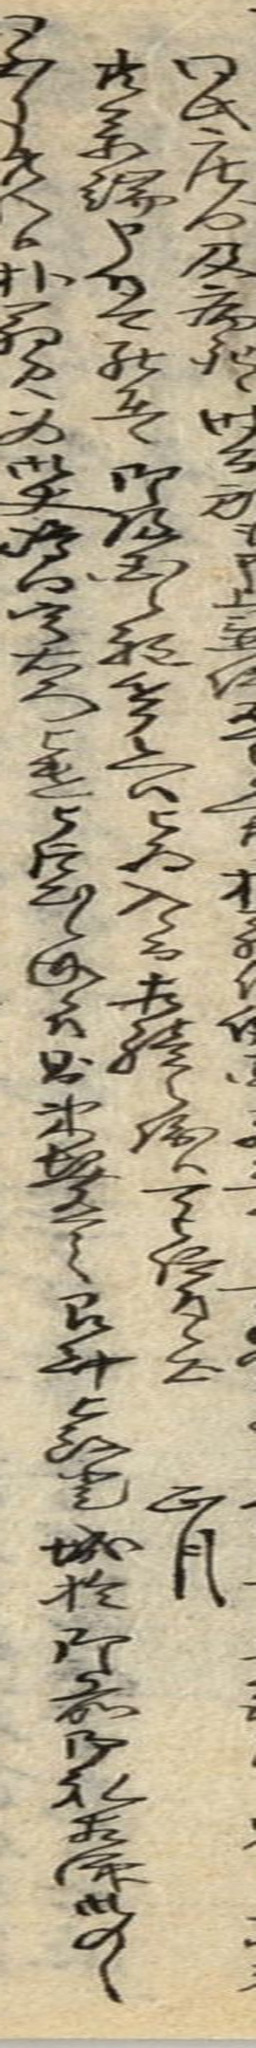同五月廿八日朴翁方へ為御使嶋田宇右衛門被遣被仰出候趣に付束髪有之即刻被致登城於御前御礼相済御のし
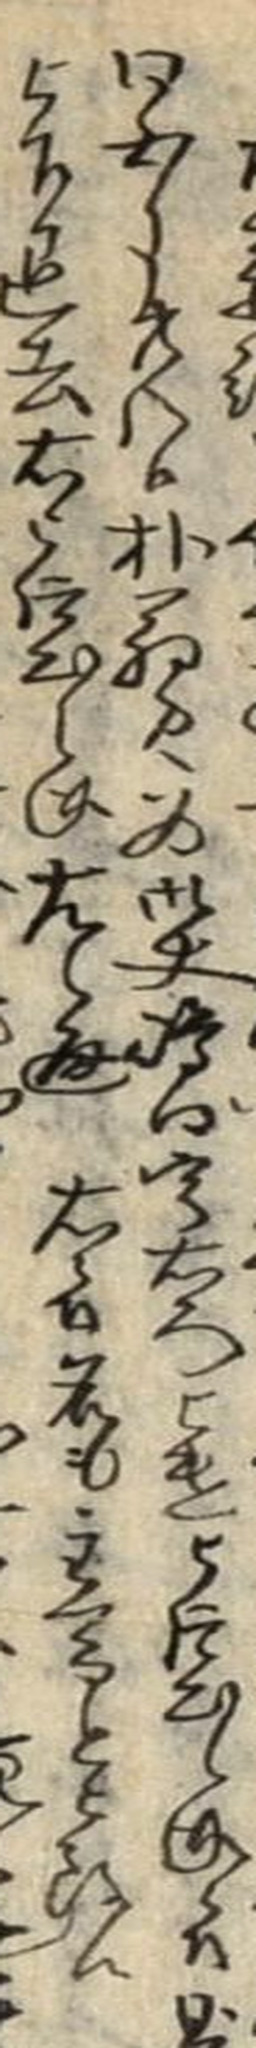被下退去右被仰出候趣左之通右に付名も主馬と被改候
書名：御用并被仰出之部
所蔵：福井県文書館 Fukui Prefectural Archives
